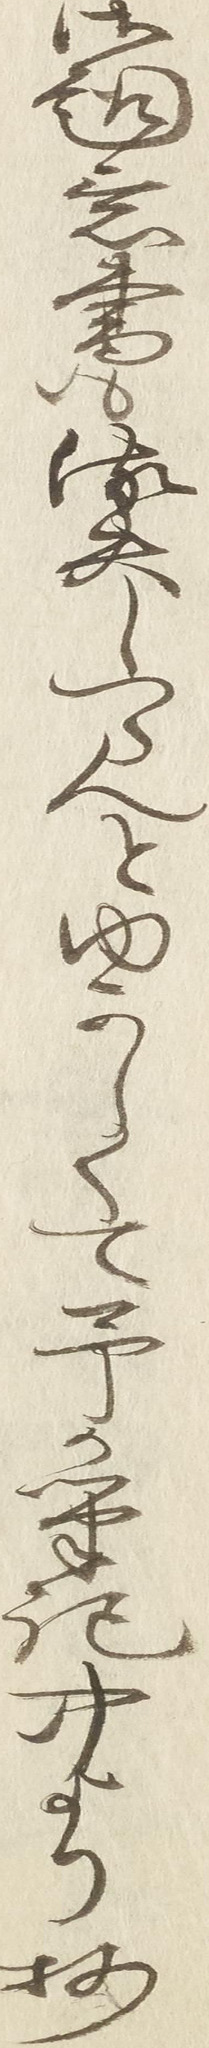御趣意書も流失しつらんとゆかしくて予の筆記中より抄
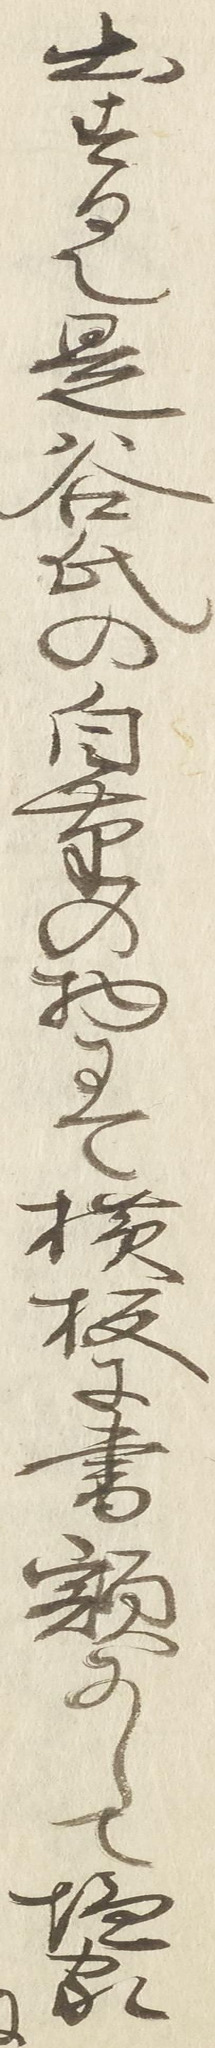出する也是谷氏の自筆の物にて横板に書額にして塩屋に
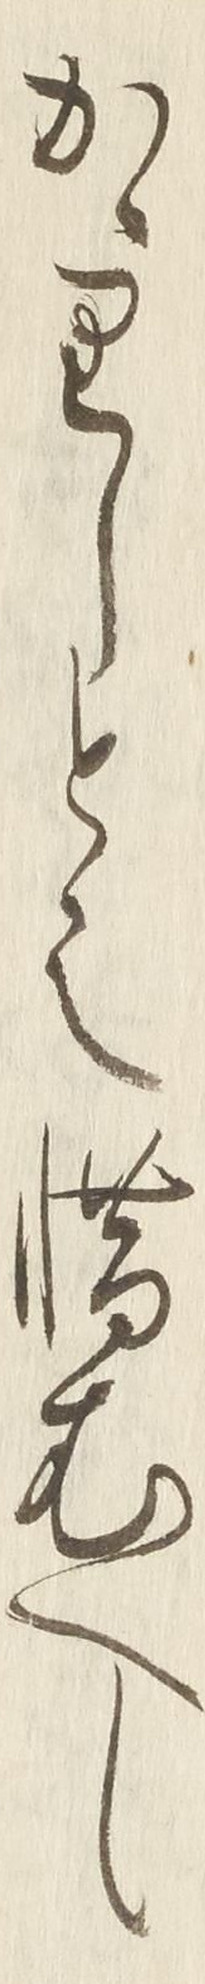かゝりしと也惜むへし
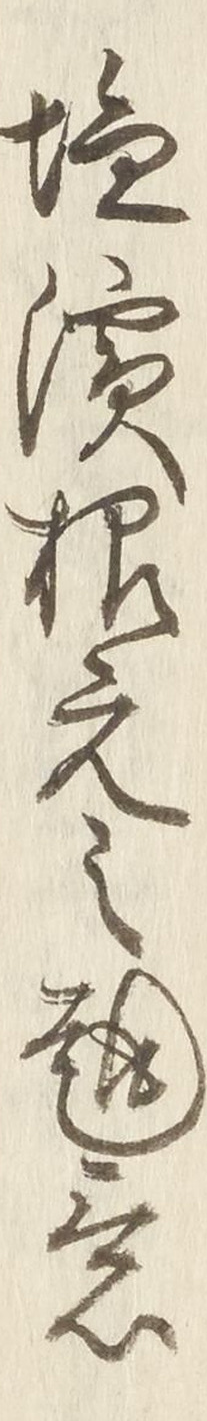塩浜根元之趣意
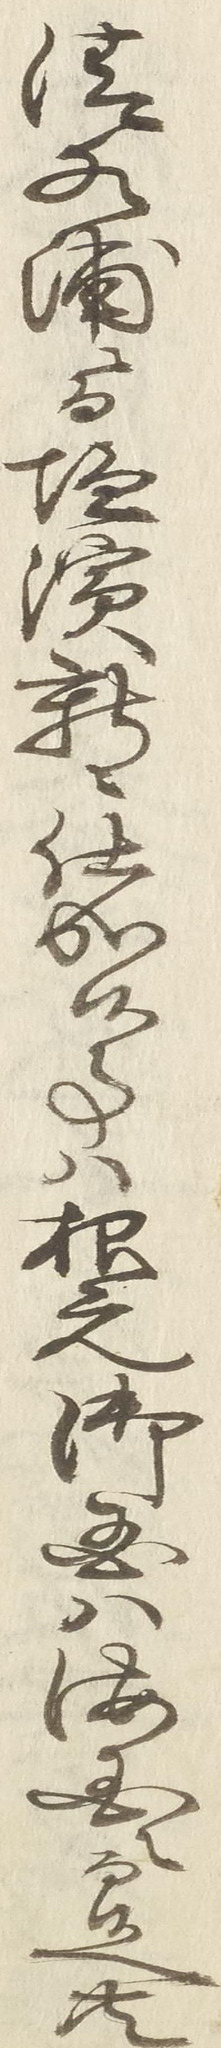清水浦にて塩浜新に仕成候事は根元御国は海国にて候へ共
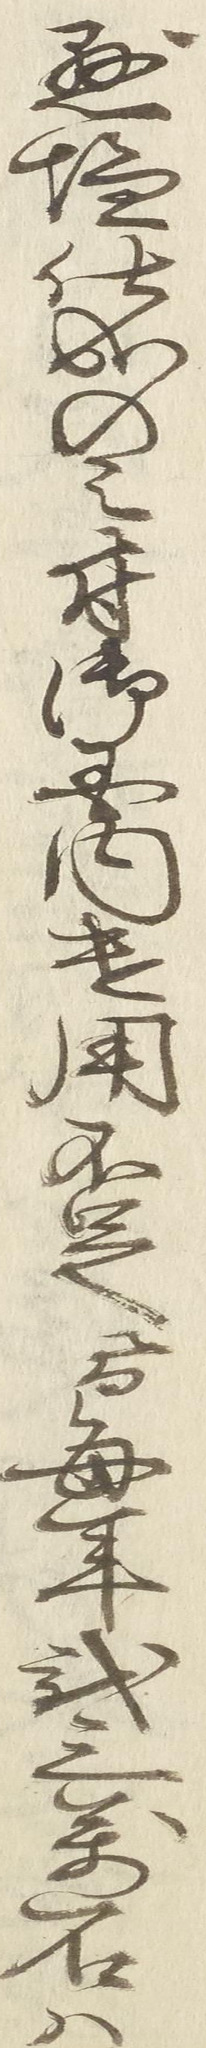懸塩仕成のみに付御国内遣用不足にて毎年弐三万石は
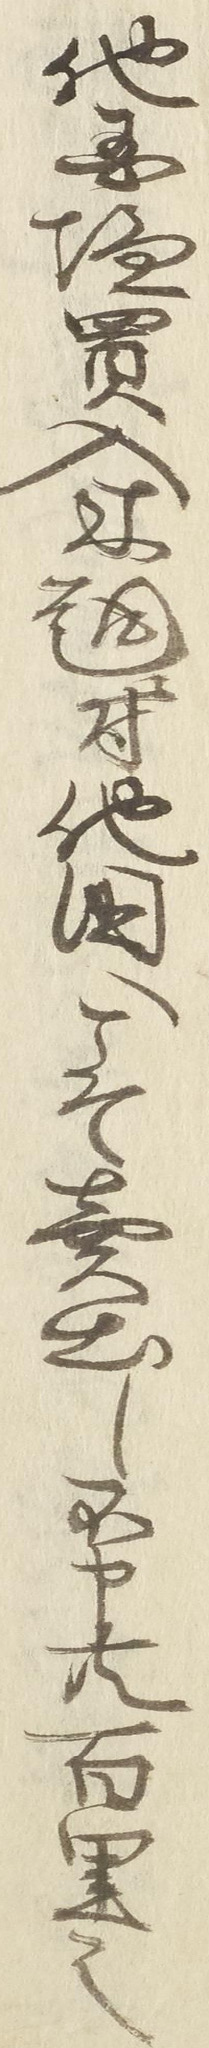他国塩買入来趣に付他国へこそ売出し不申共百里之

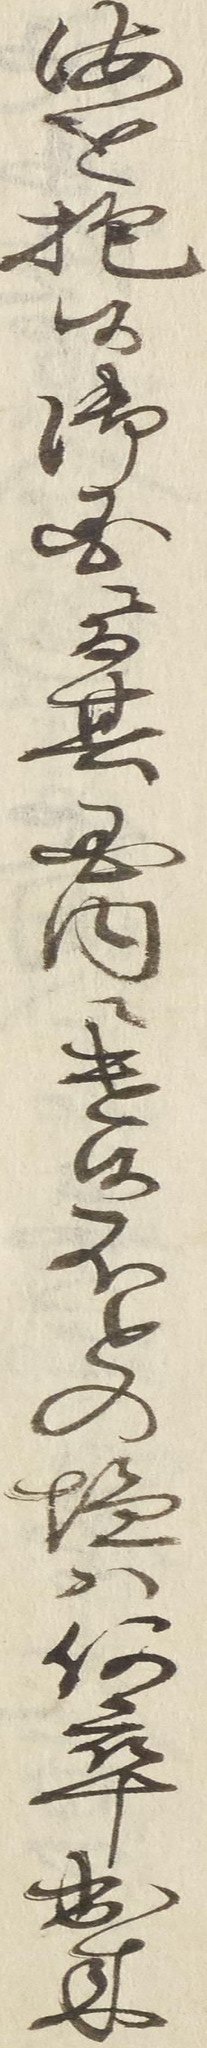海を抱候御国にて其国内に遣候ほとの塩は何卒出来
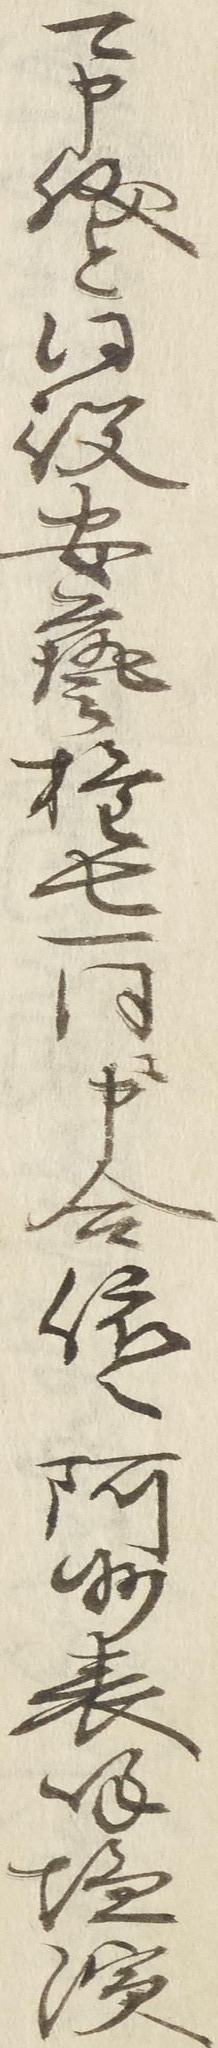可申儀とは役安芸権七一同に申合依之阿州表呼塩浜
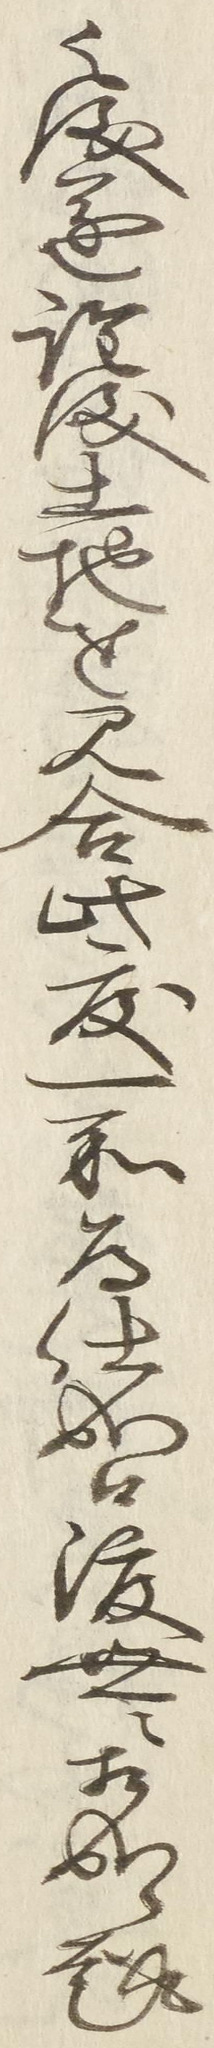之儀遂詮儀土地を見合此度一所為仕成候渡世に相成候趣
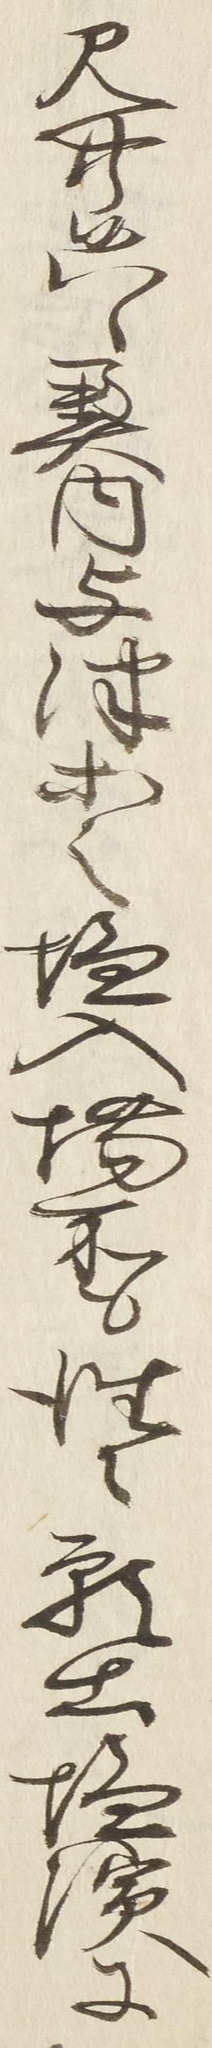見聞候はゝ奥内与津等の塩入場所も往々願出塩浜に
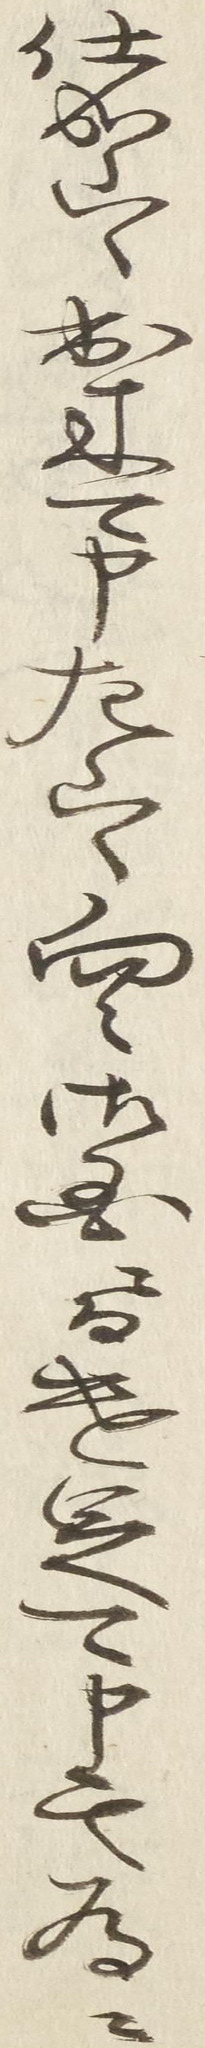仕成候はゝ出来可申左候はゝ向々御国にて遣足可申其為に
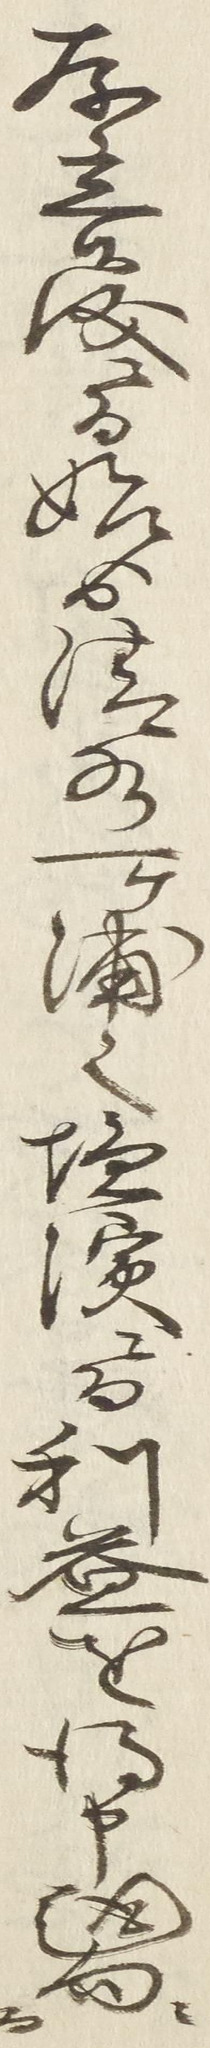存立候儀にて始より清水一ヶ浦の塩浜にて利益を得申趣向にて
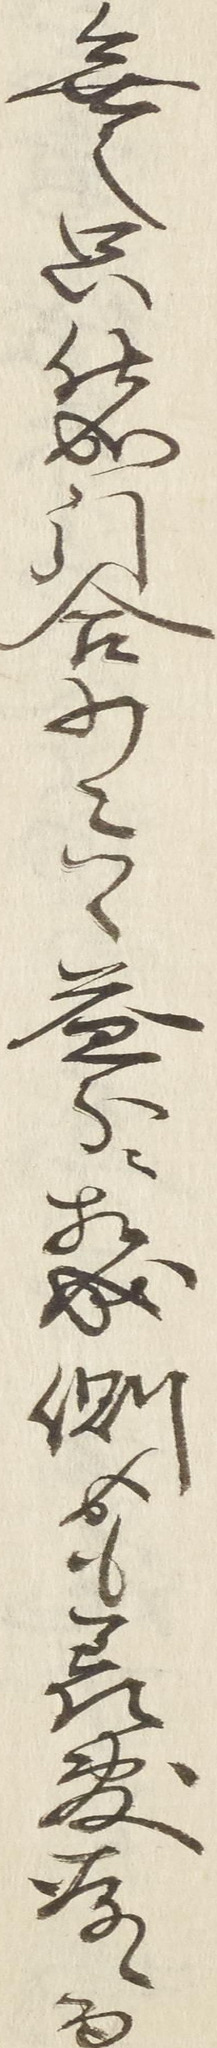無之只仕成引合少々つゝ益分に相成側よりも尋敷存候て
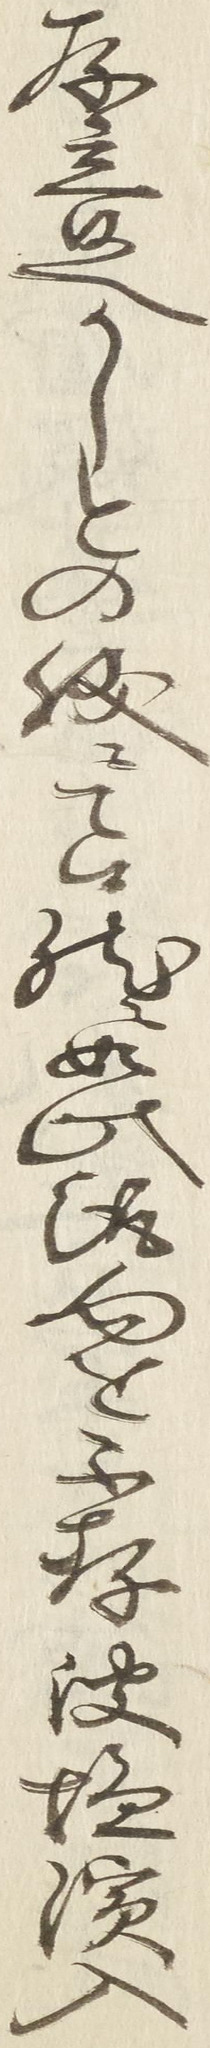存立候へかしとの儀にて候然に如此趣向を不存波塩浜入
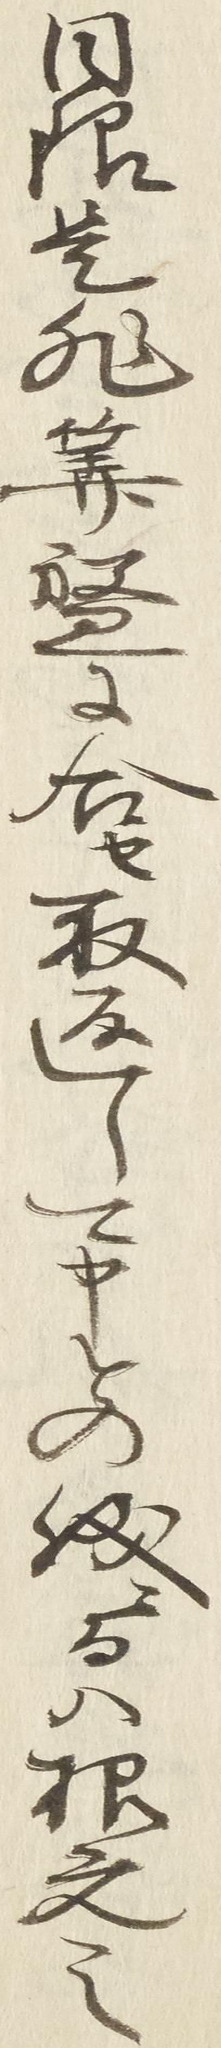同限是非算盤に合せ取返し可申との儀にては根元の
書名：地震記　上
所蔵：東京大学地震研究所図書室 Earthquake Research Institute Library, The University of Tokyo, JAPAN
